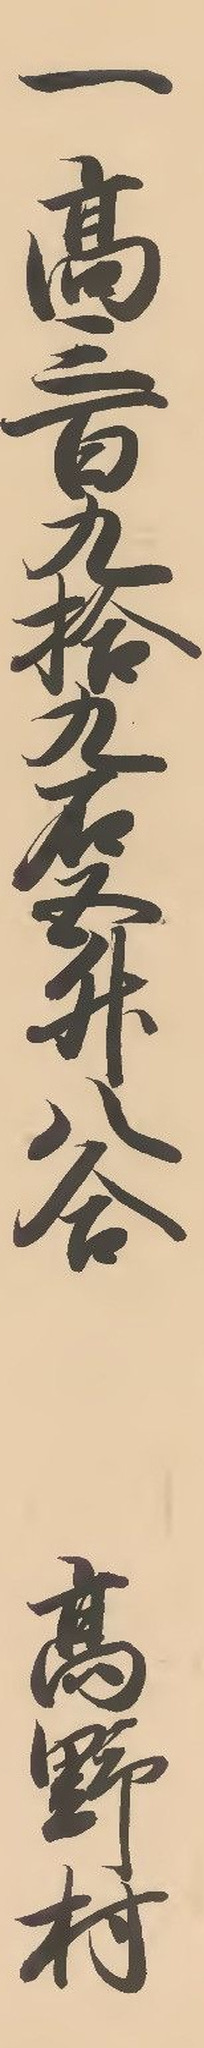一高三百九拾九石五升八合高野村
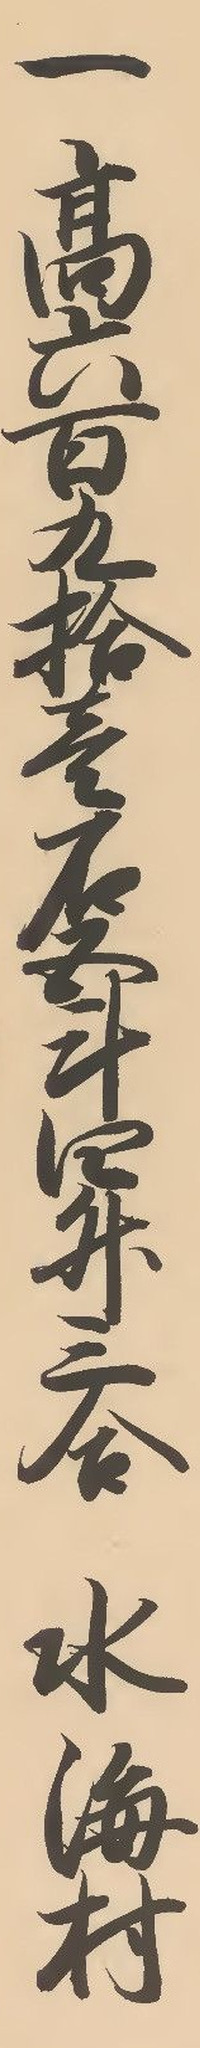一高六百九拾壱石五斗四升三合水海村

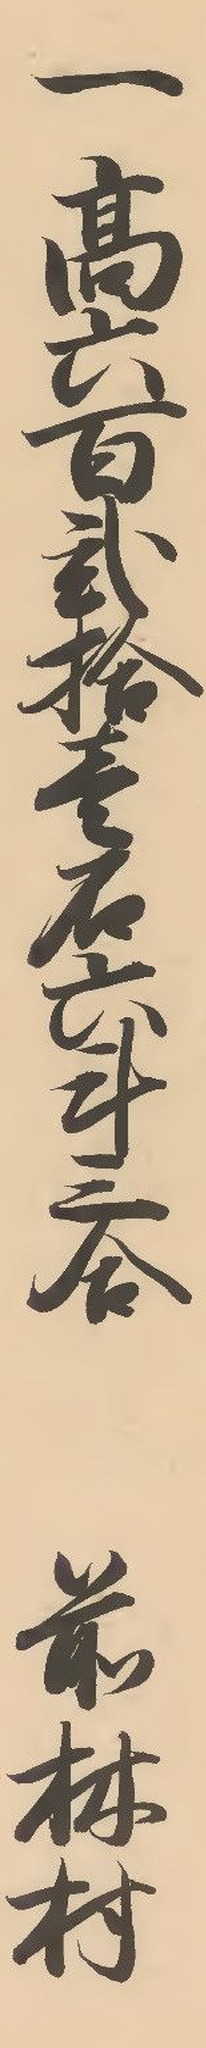一高六百弐拾壱石六斗三合前林村
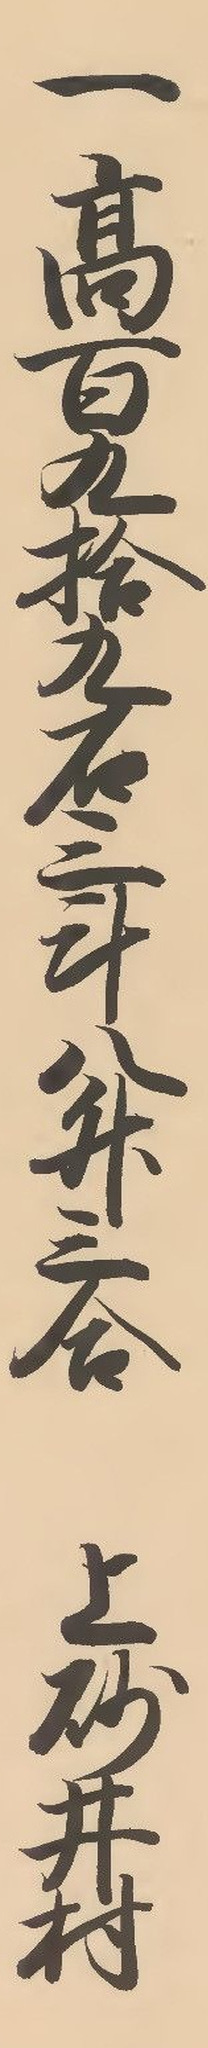一高百九拾九石三斗八升三合上砂井村
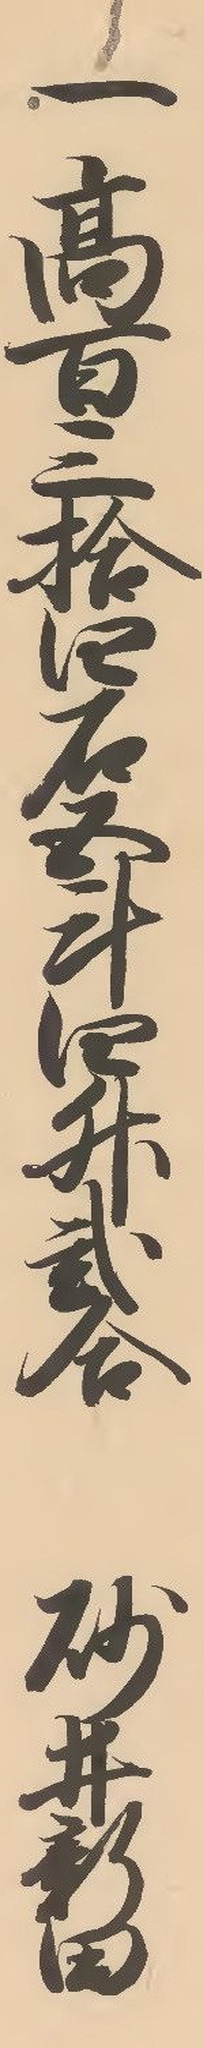一高百三拾四石五斗四升弐合砂井新田
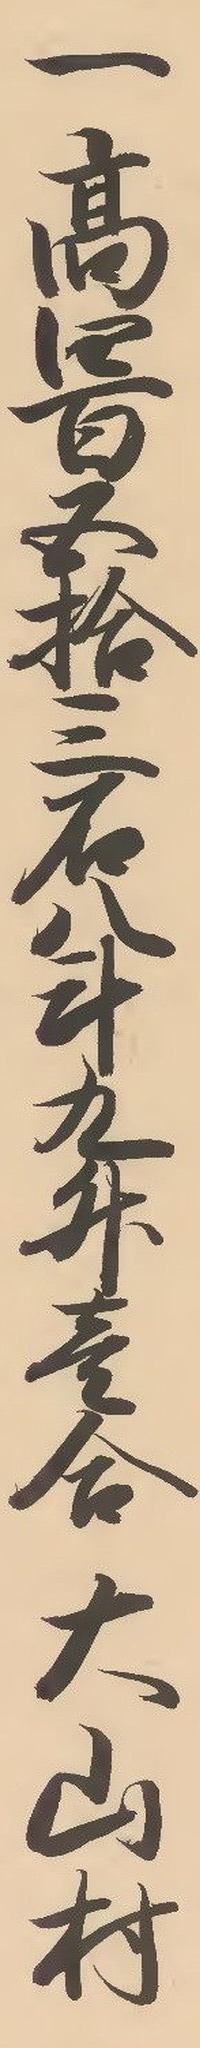一高四百五拾三石八斗九升壱合大山村
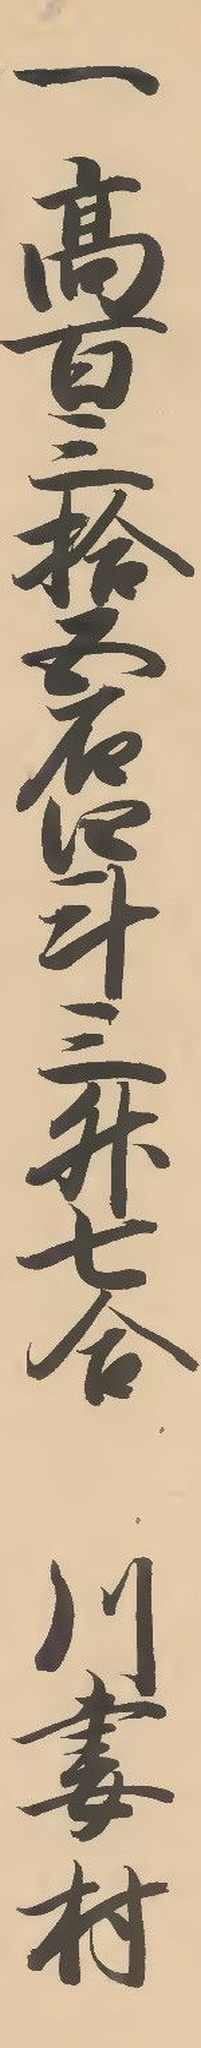一高百三拾五石四斗三升七合川妻村
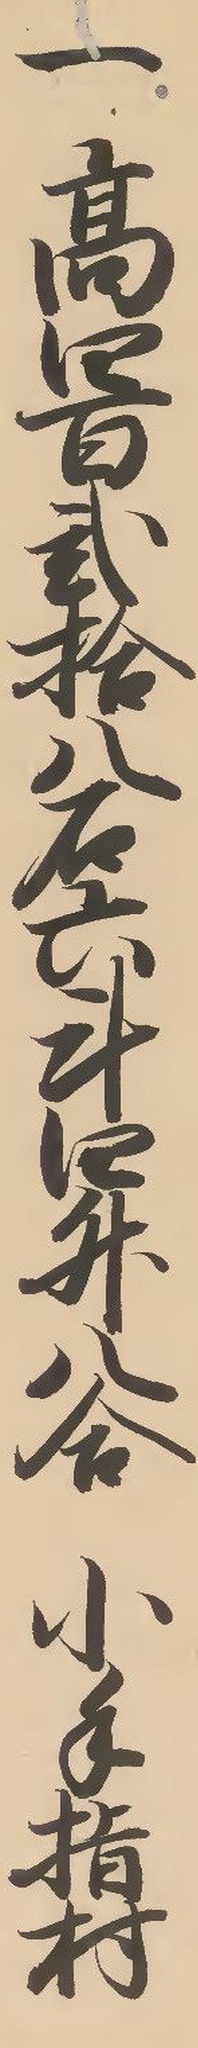一高四百弐拾八石六斗四升八合小手指村
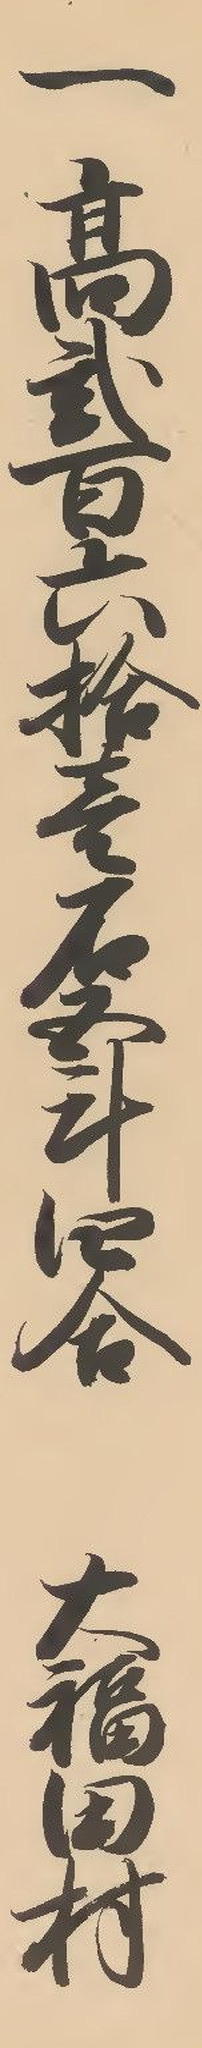一高弐百六拾壱石五斗四合大福田村
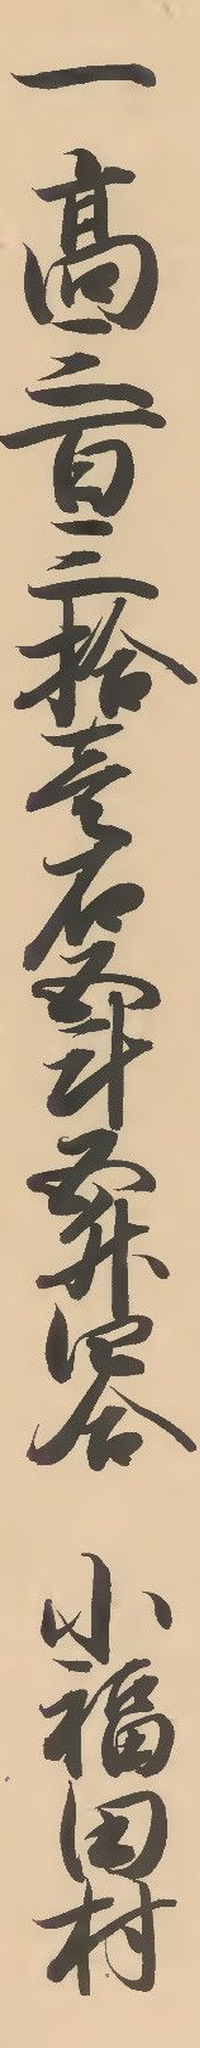一高三百三拾壱石五斗五升四合小福田村

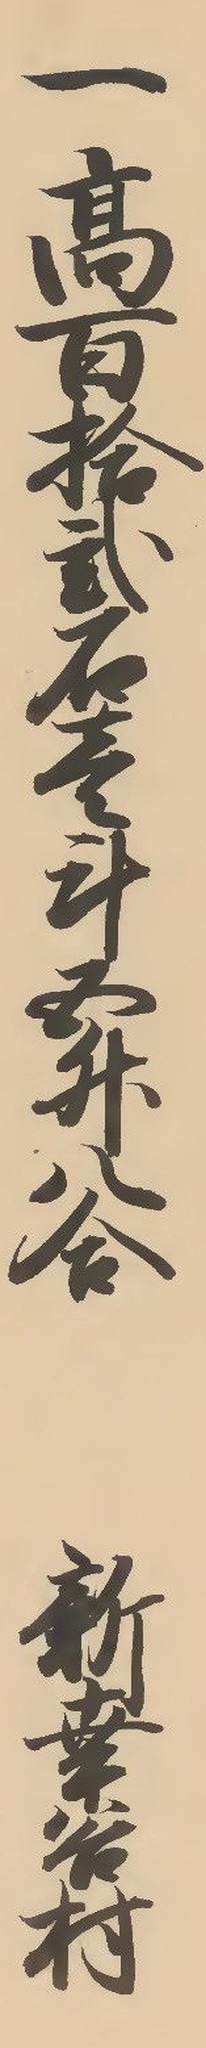一高百拾弐石壱斗五升八合新幸谷村
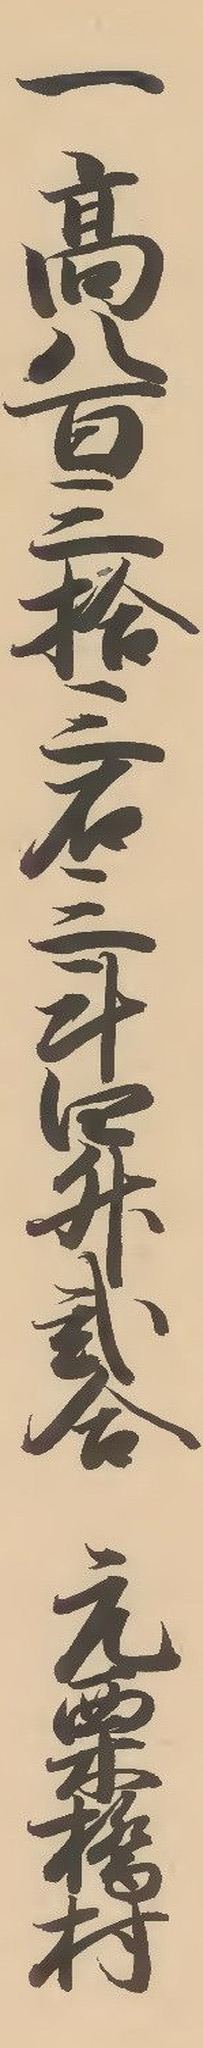一高八百三拾三石三斗四升弐合元栗橋村
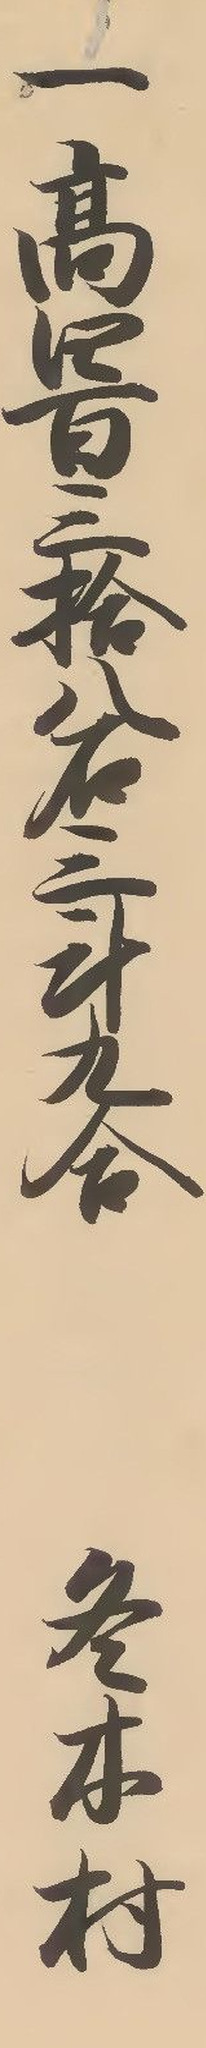一高四百三拾八石三斗九合冬木村
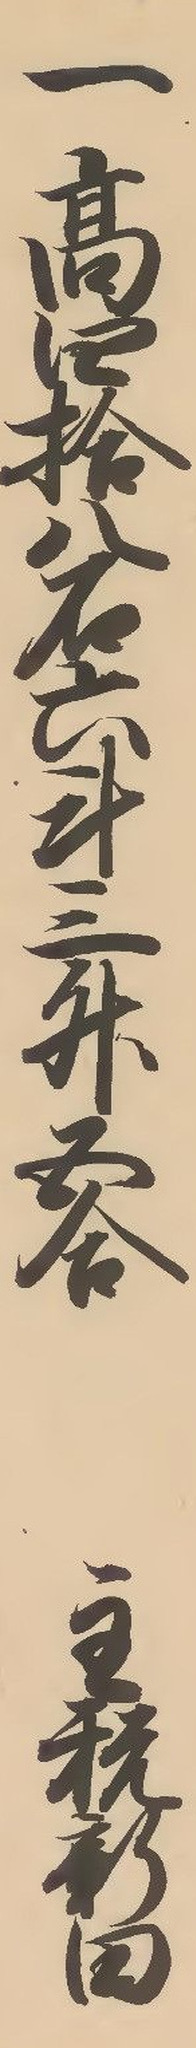一高四拾八石六斗三升五合主祝新田
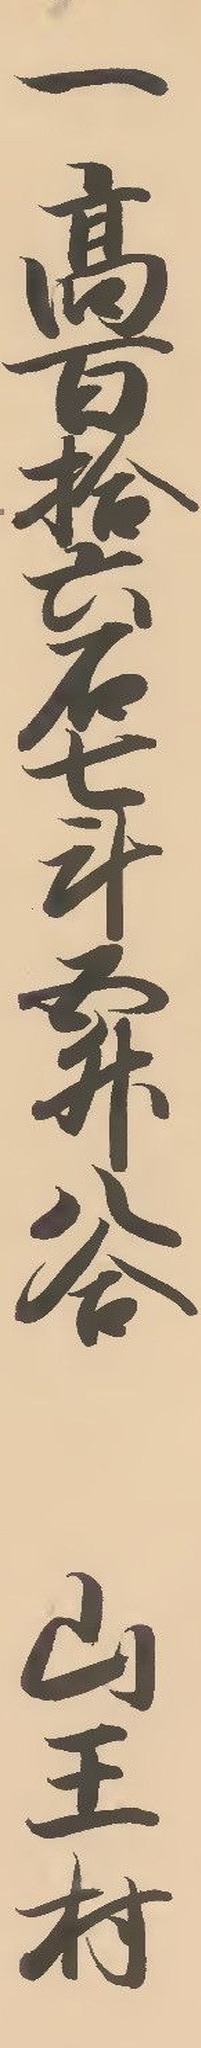一高百拾六石七斗五升八合山王村
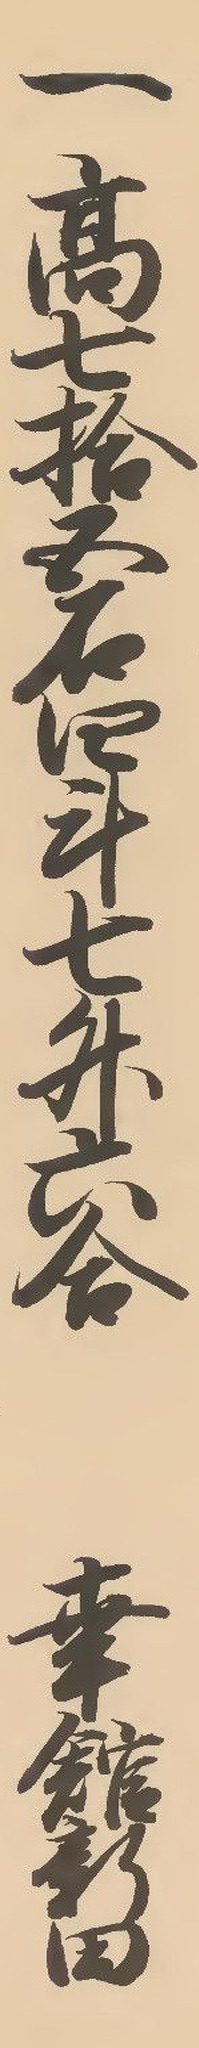一高七拾五石四斗七升六合幸館新田
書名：下総国郷帳
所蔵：国立公文書館 National Archives of Japan
